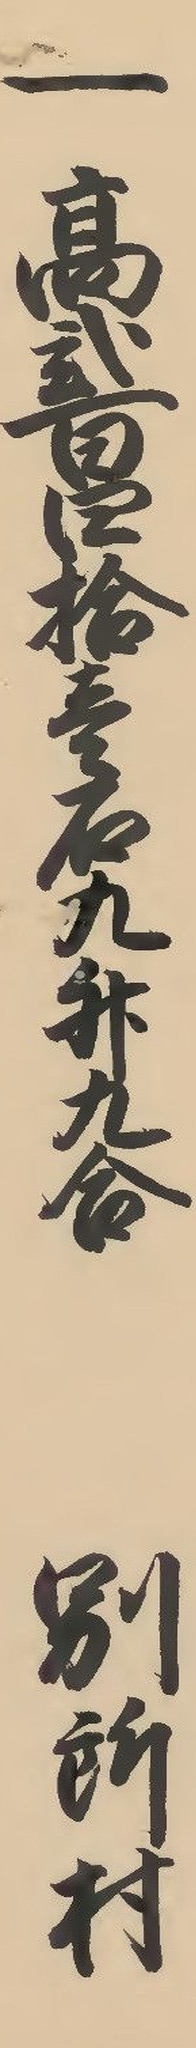一高弐百四拾壱石九升九合別所村

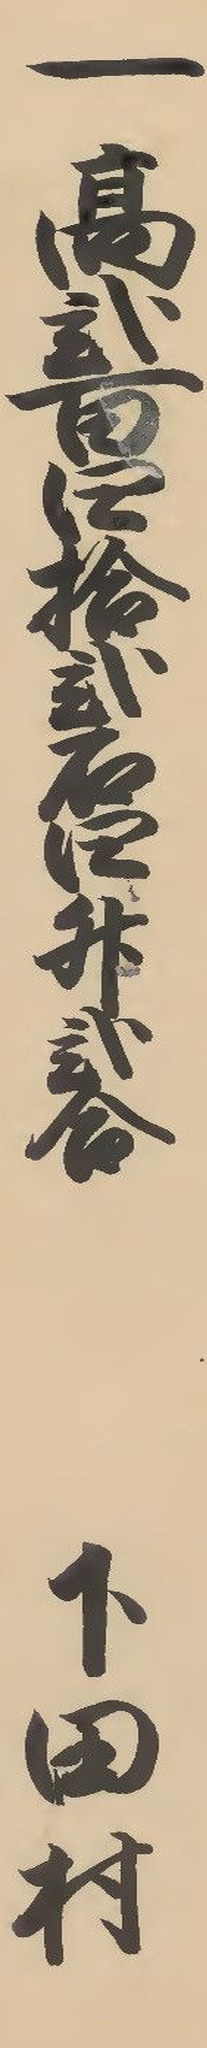一高弐百四拾弐石四升弐合下田村
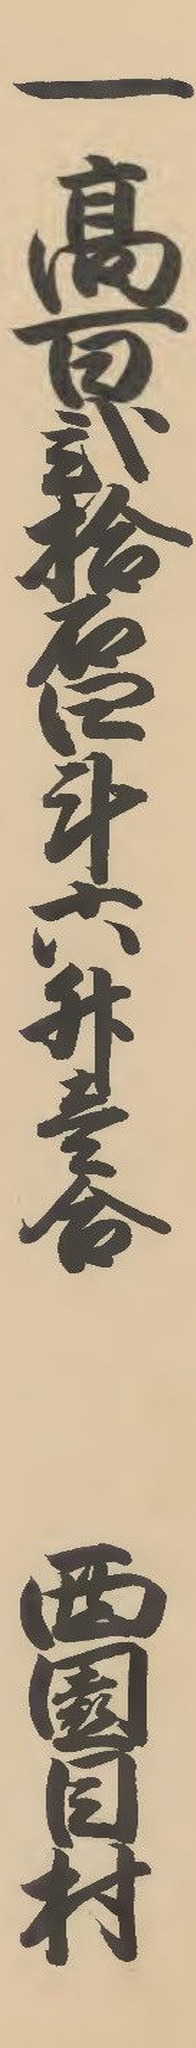一高百弐拾石四斗六升壱合西園目村
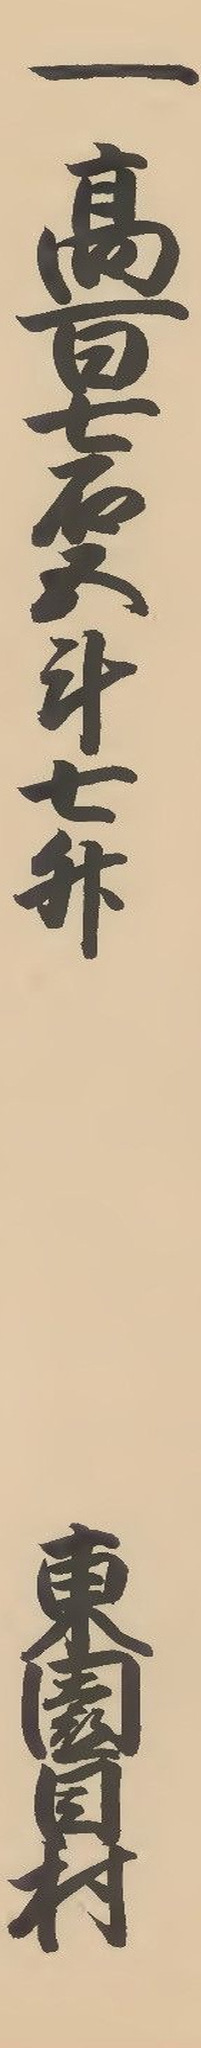一高百七石五斗七升東園目村
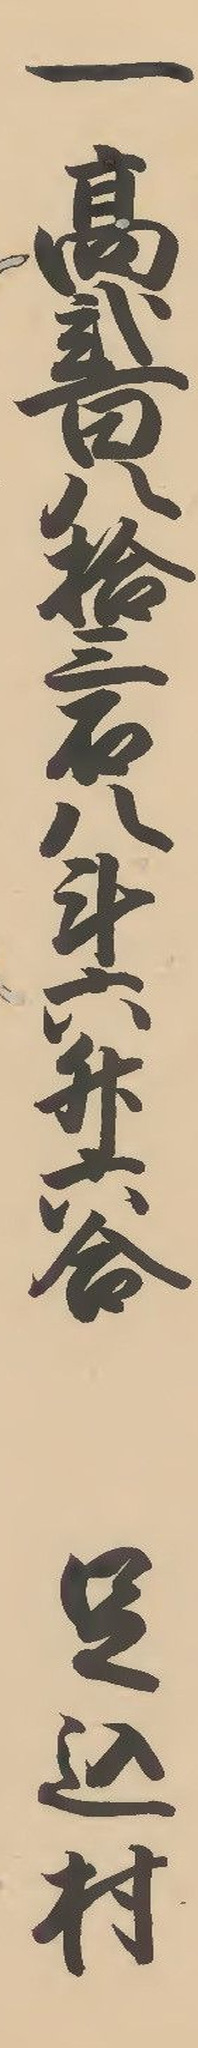一高弐百八拾三石八斗六升六合足込村
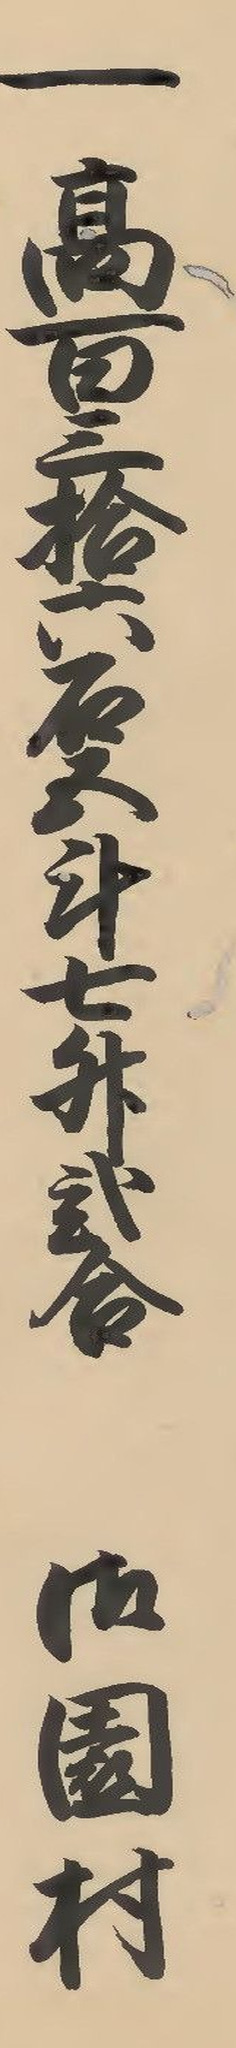一高百三拾六石五斗七升弐合御園村
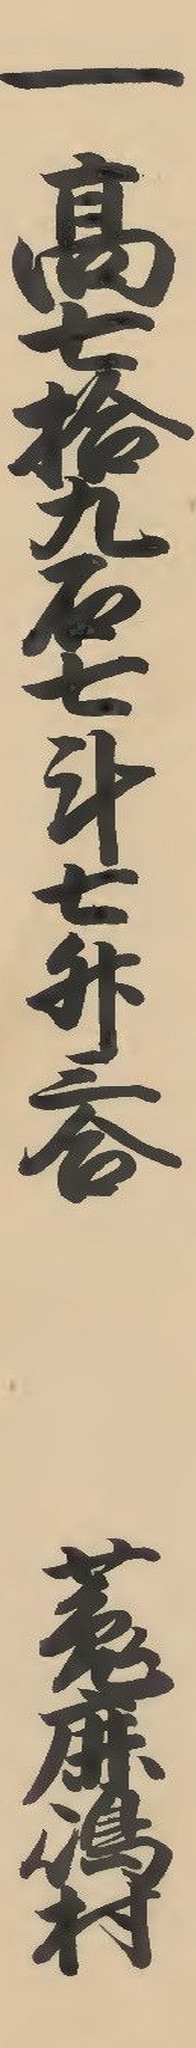一高七拾九石七斗七升三合菟鹿島村
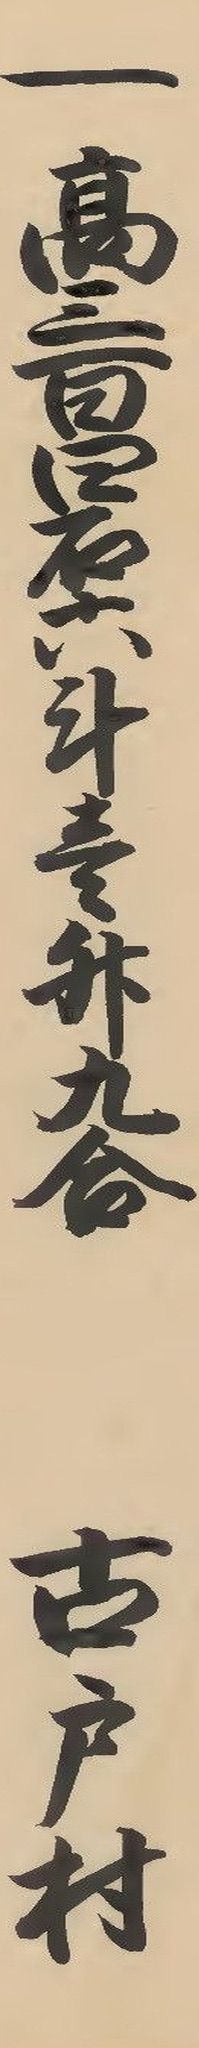一高三百四石六斗壱升九合古戸村
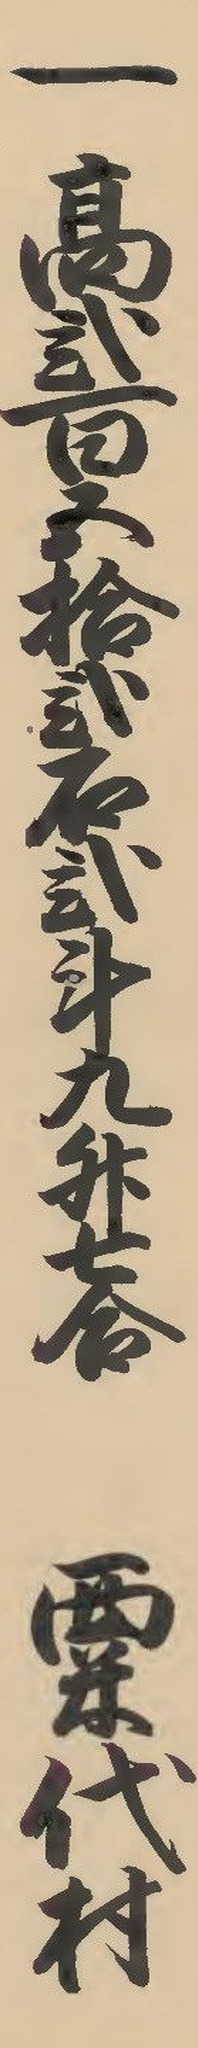一高弐百五拾弐石弐斗九升七合粟代村

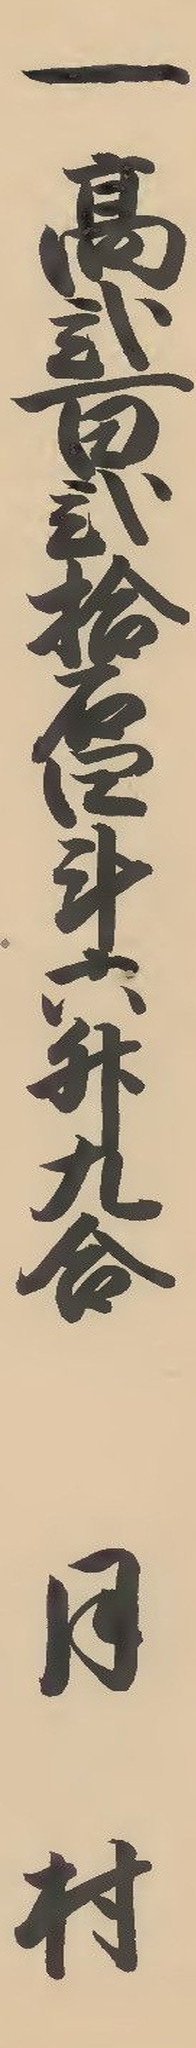一高弐百弐拾石四斗六升九合月村
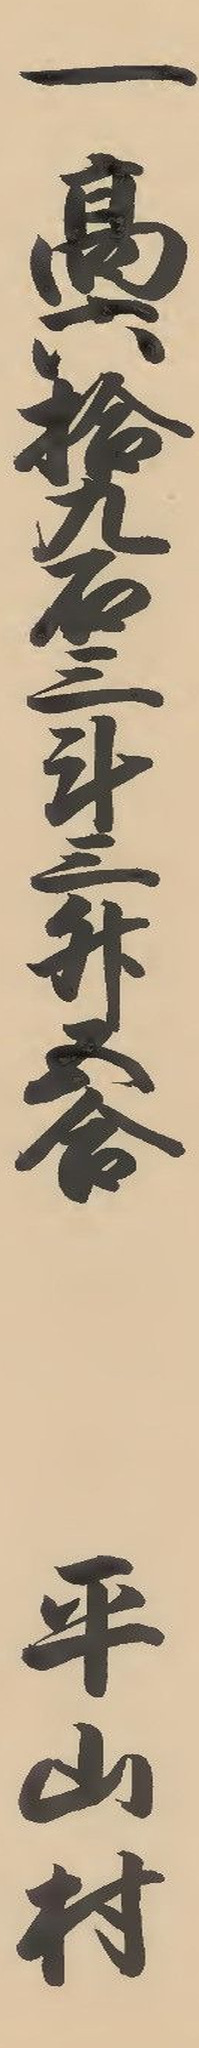一高六拾九石三斗三升五合平山村
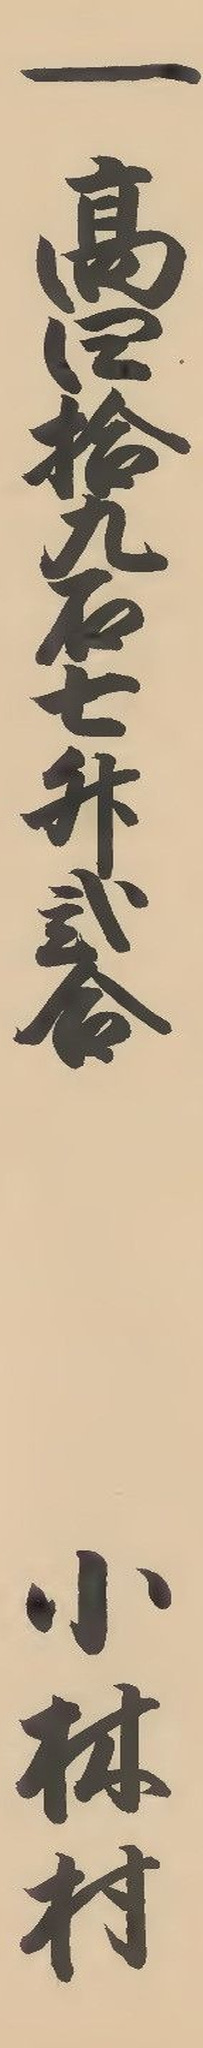一高四拾九石七升弐合小林村
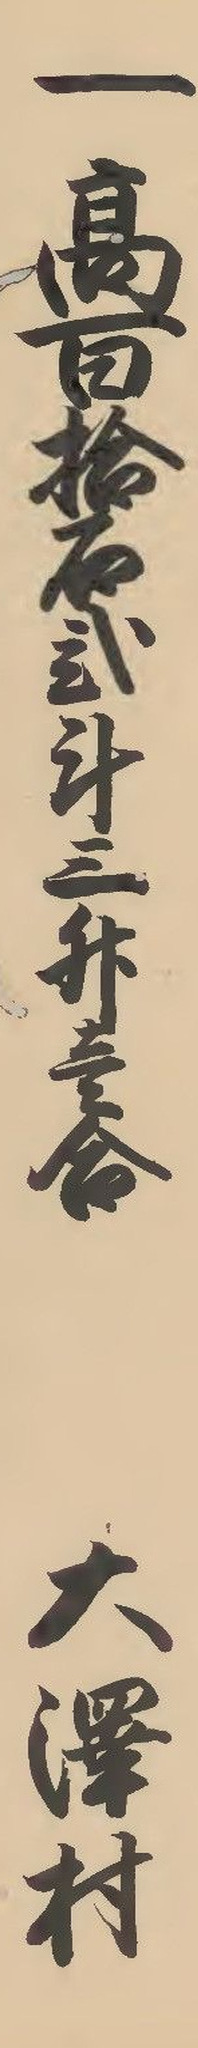一高百拾石弐斗三升壱合大沢村
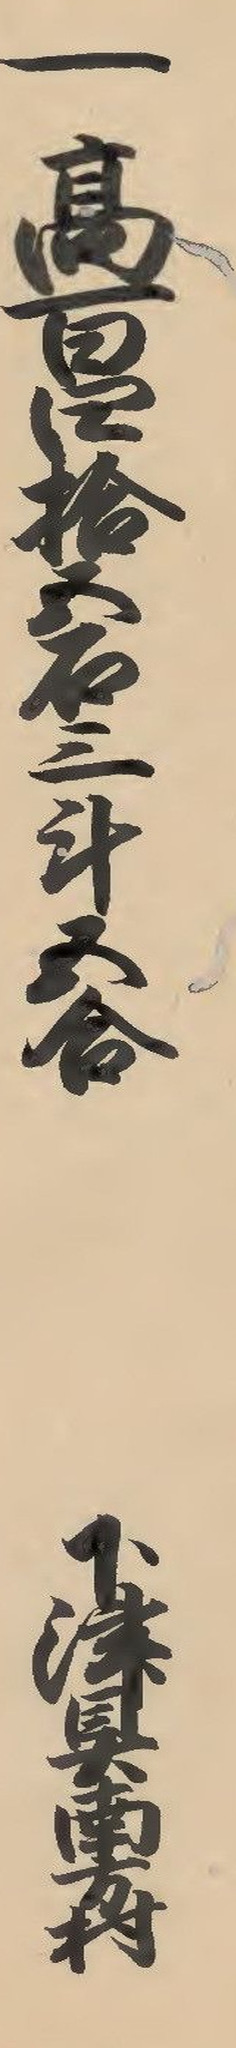一高百四拾五石三斗五合下津具南方村
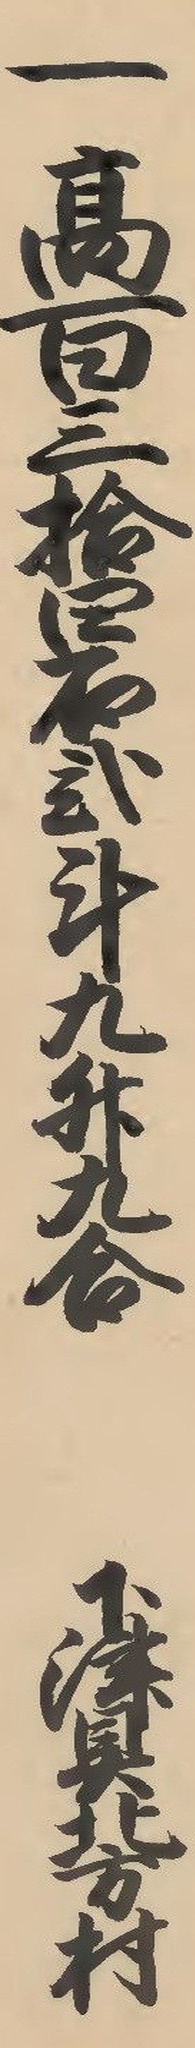一高百三拾四石弐斗九升九合下津具北方村
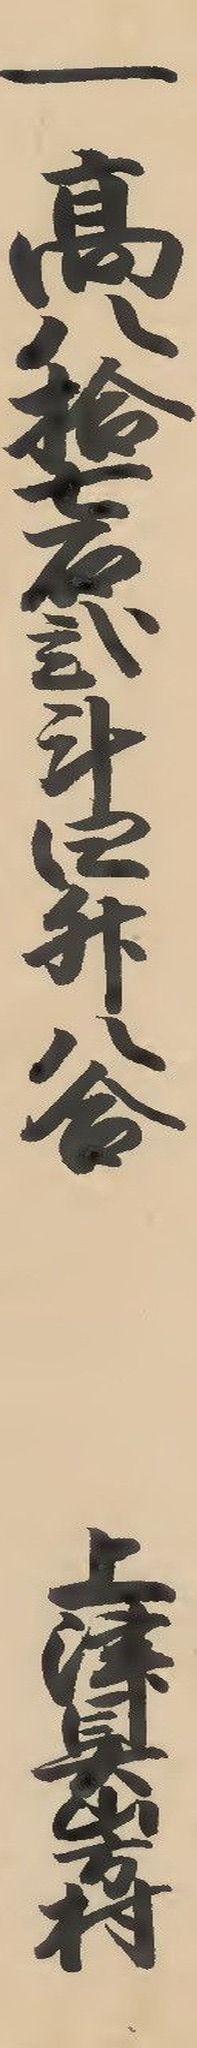一高八拾七石弐斗四升八合上津具山方村
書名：三河国郷帳
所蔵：国立公文書館 National Archives of Japan
